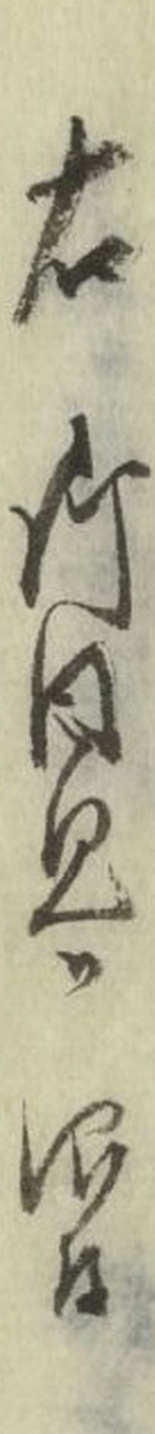右御目見被仰付
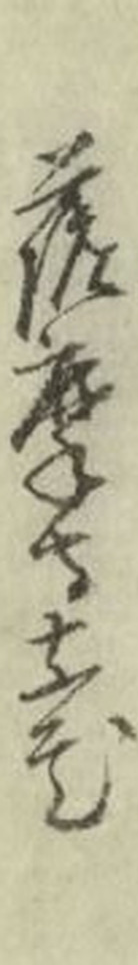薩摩守家来
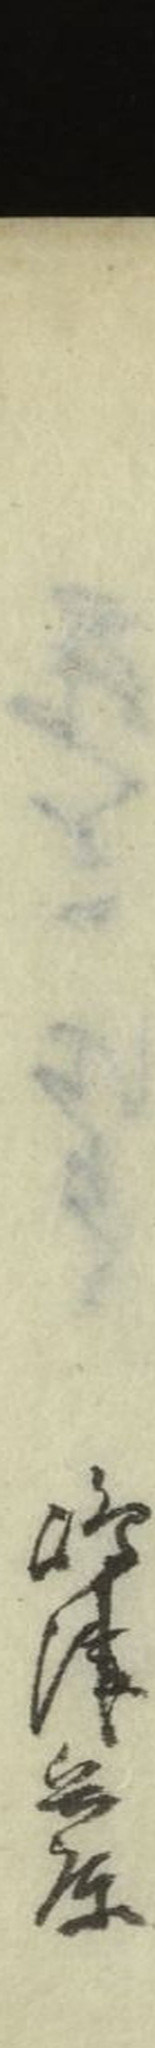島津兵庫
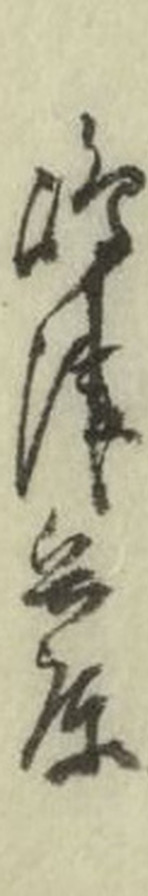島津兵庫
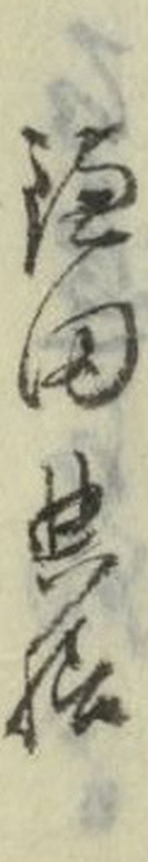鎌田典膳
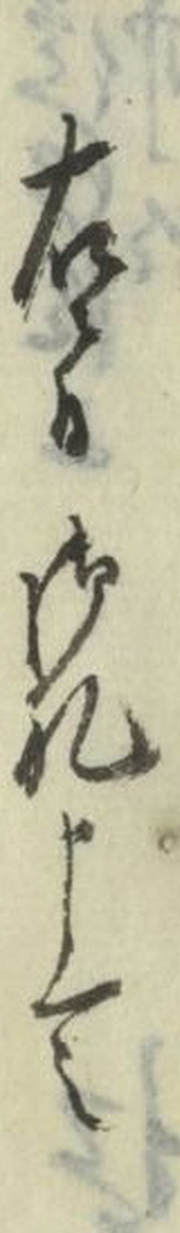右に付御礼申上之
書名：琉球人来朝記 四之五
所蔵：University of the Ryukyus Library
